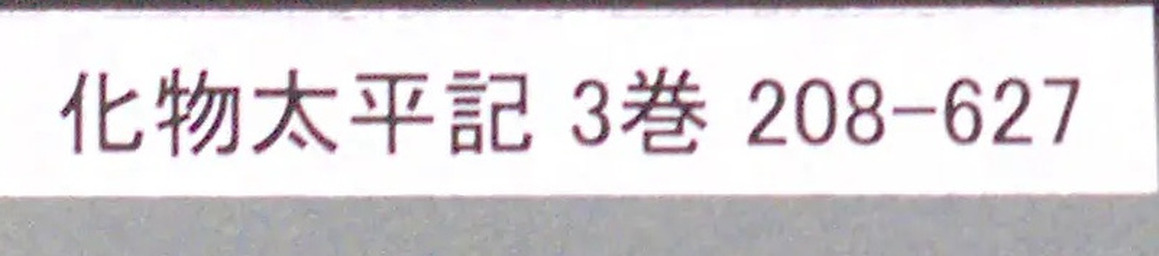怪物太平記完
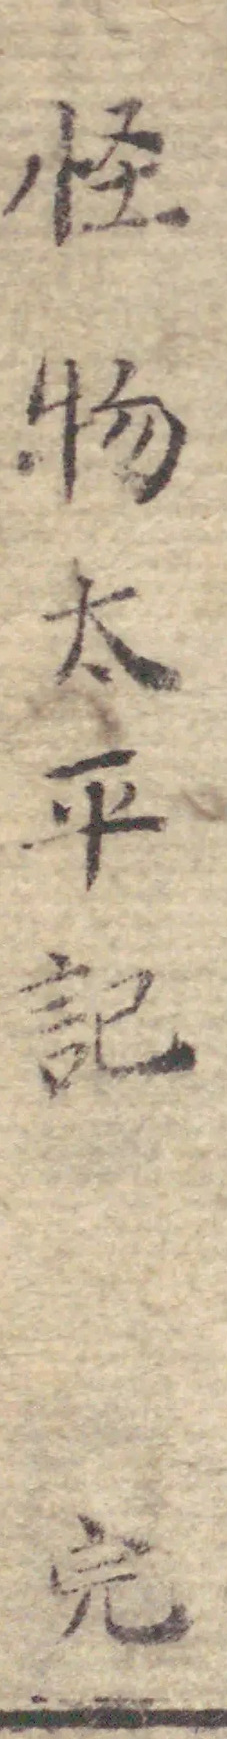怪物太平記完

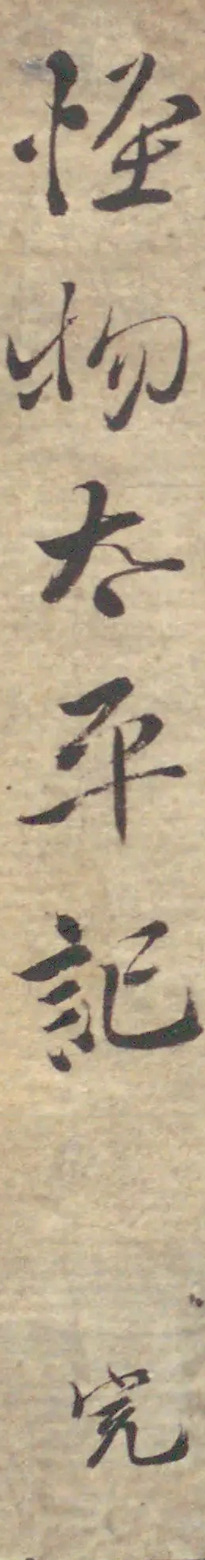怪物太閤記完

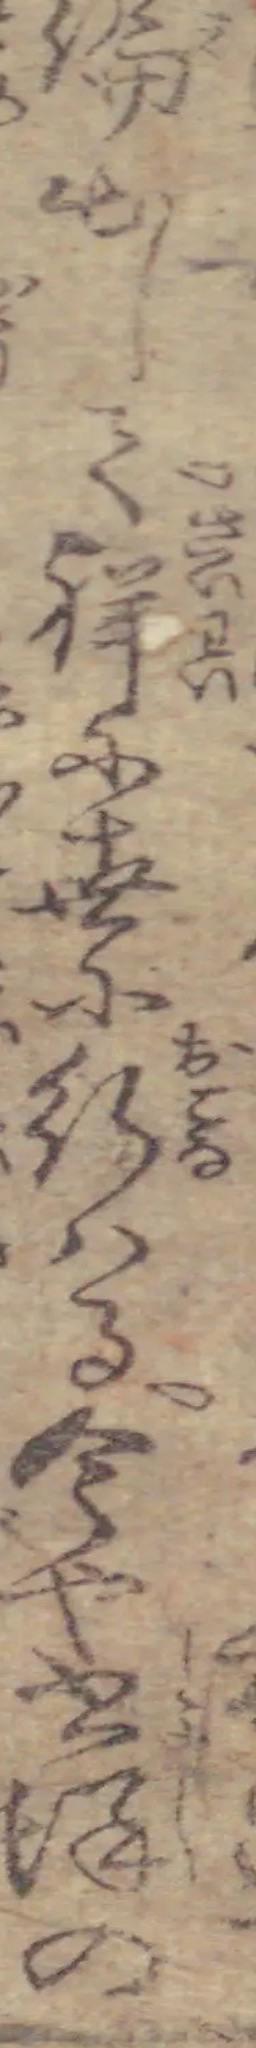編出して祥に世に行はる。今や書肆の
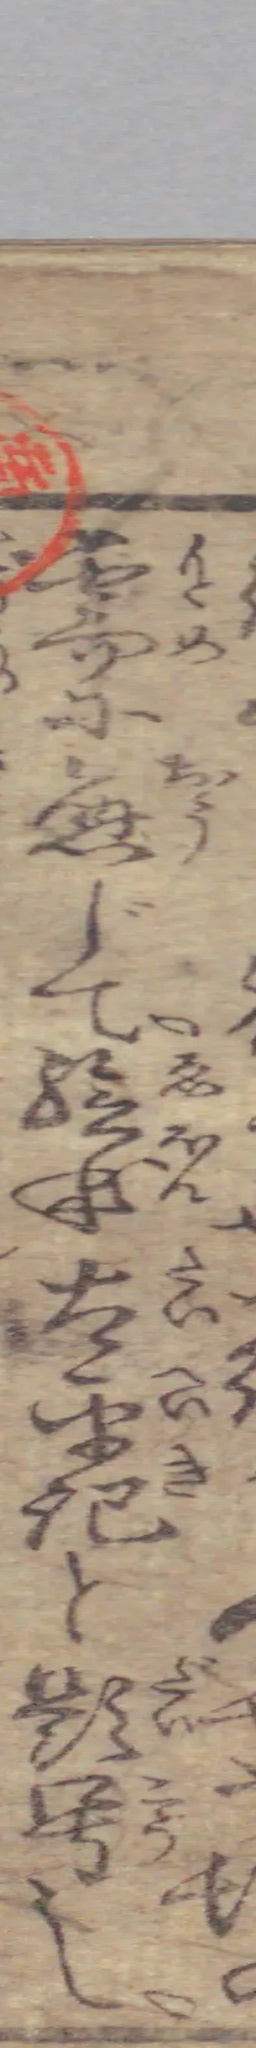需に応じて。絵本太平記と題号し。
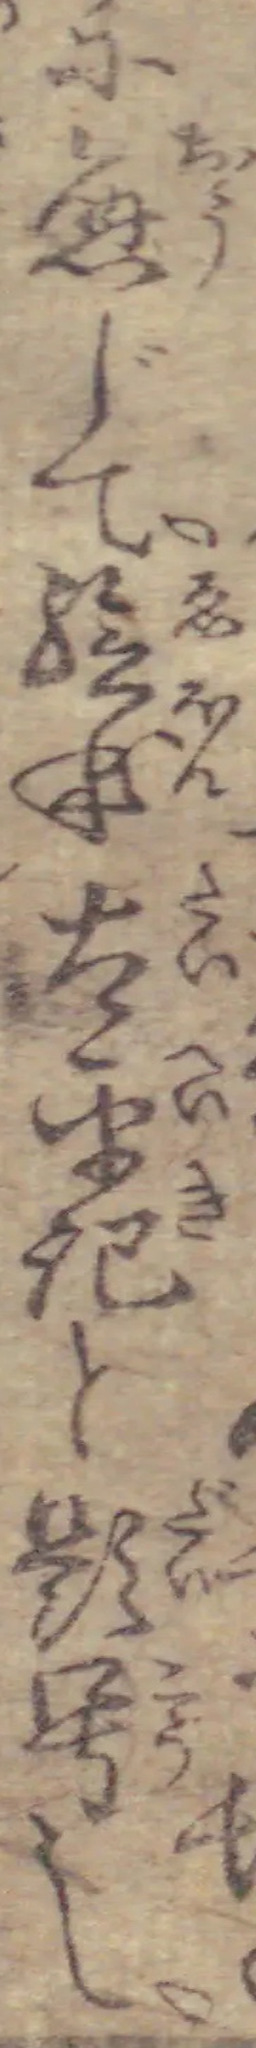需に応じて。絵本太平記と題号し。
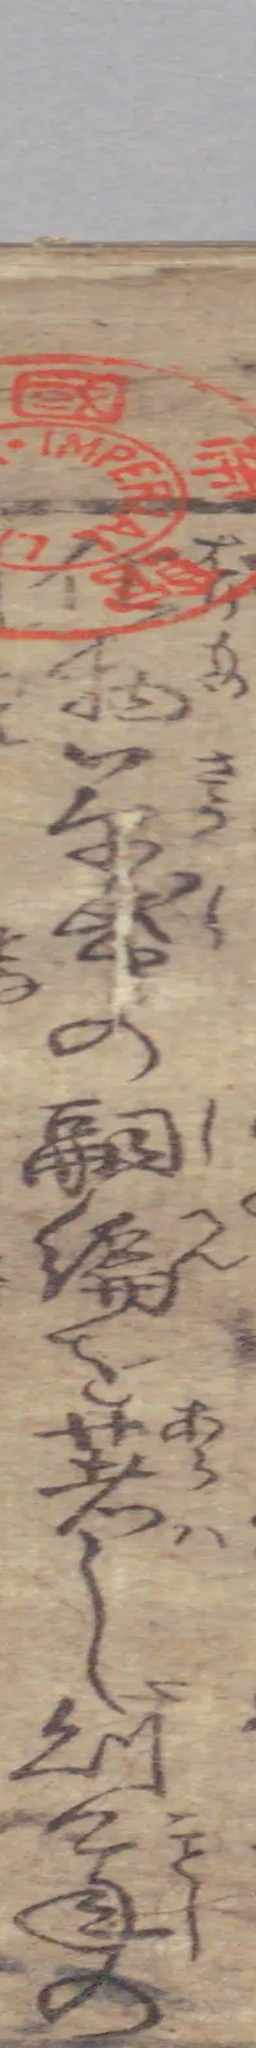化物草紙の嗣編を著し刻こ年の
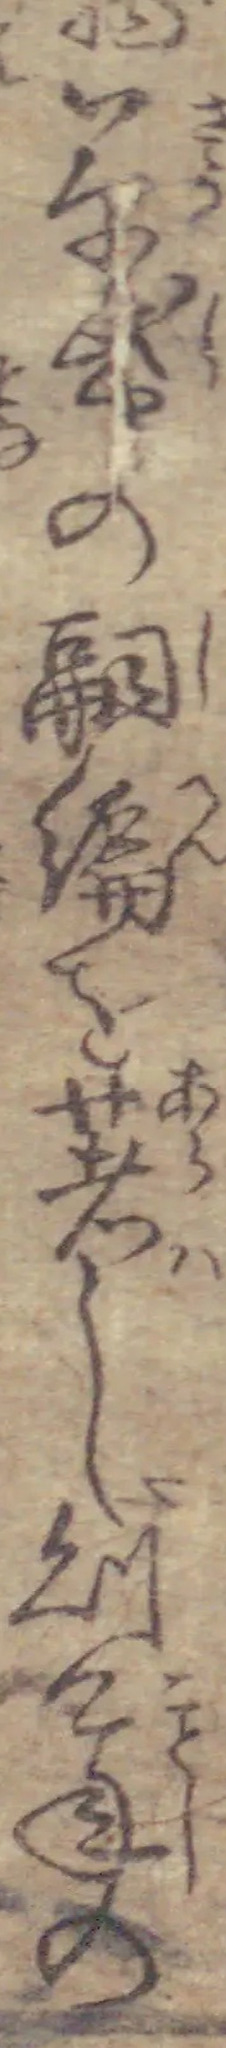化物草紙の嗣編を著し刻こ年の
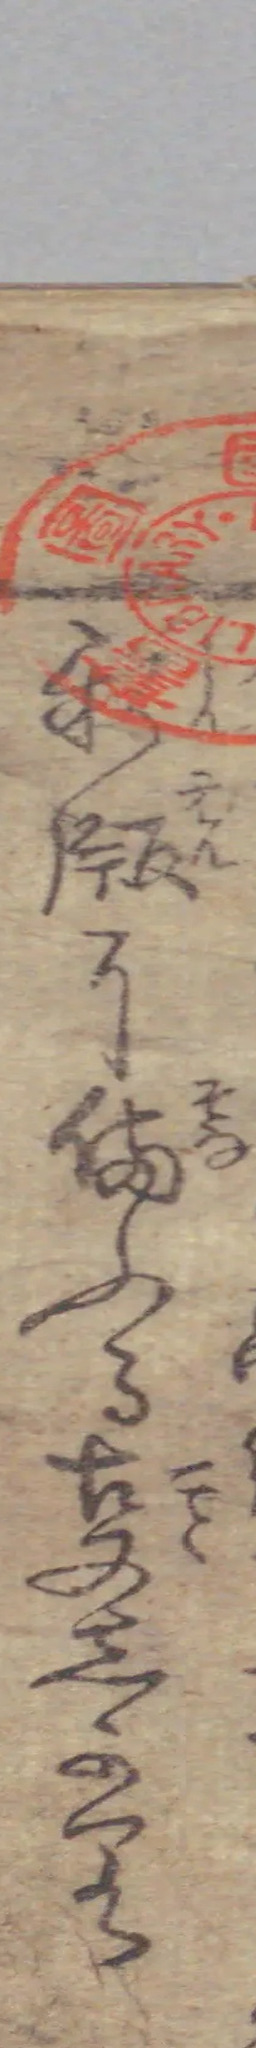新版に備ふる事のしかり
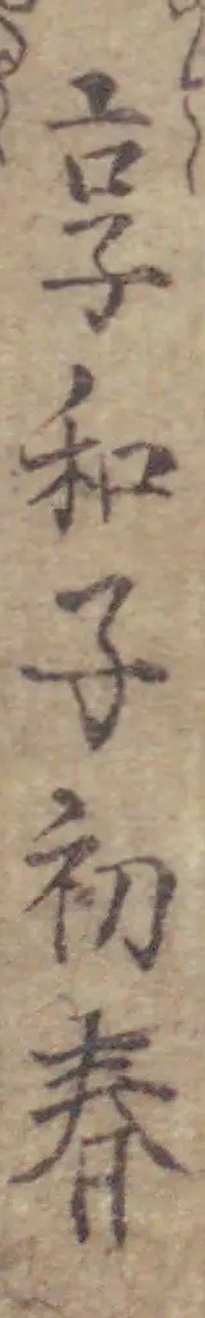享和子初春

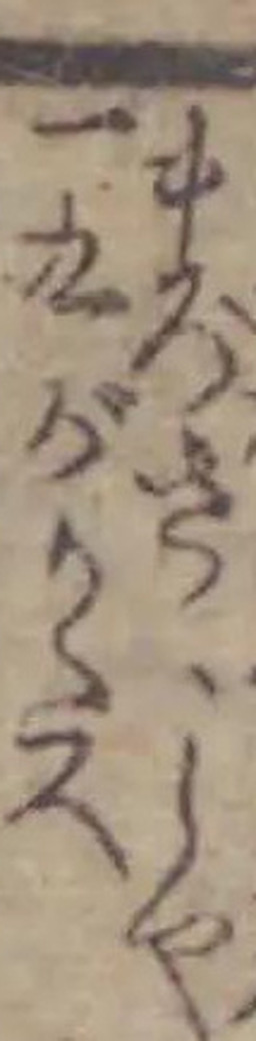一九がかたへ
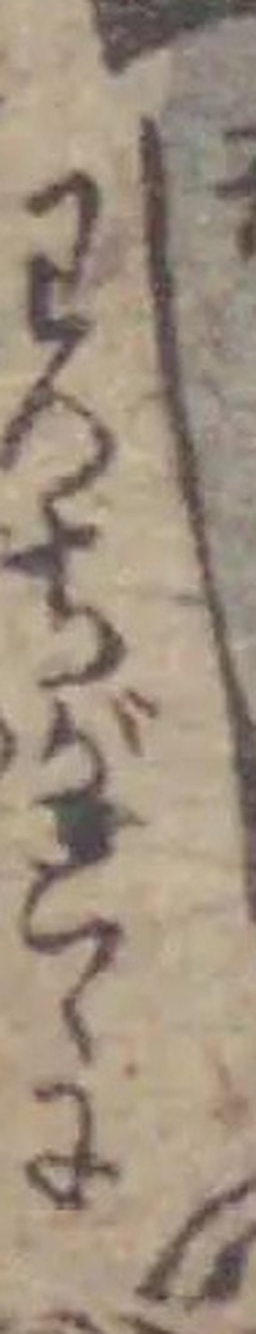わつちがこゝに
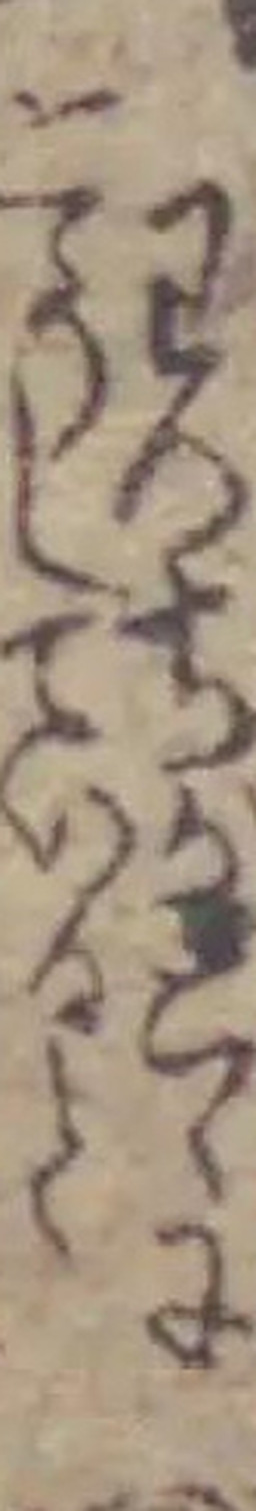こうしていると
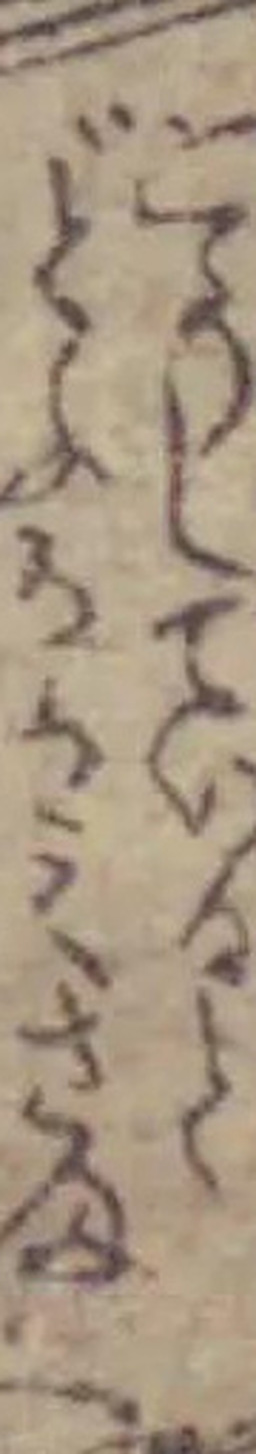どふかかみさま
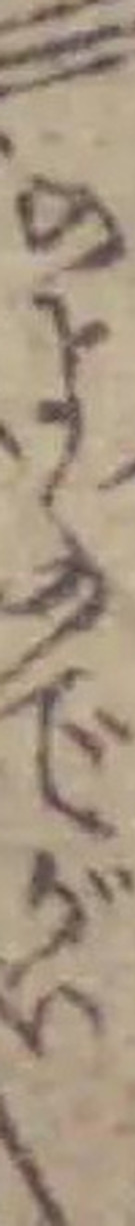のよふでがい

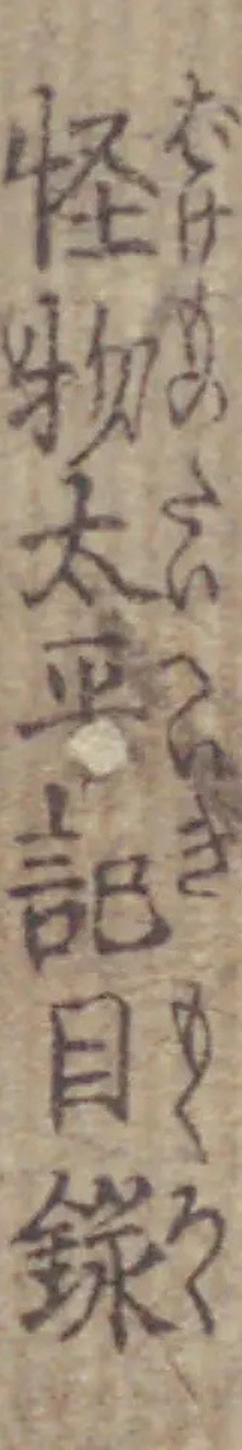怪物太平記目録
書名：化物太平記 3巻
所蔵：国立国会図書館 National Diet Library, JAPAN
